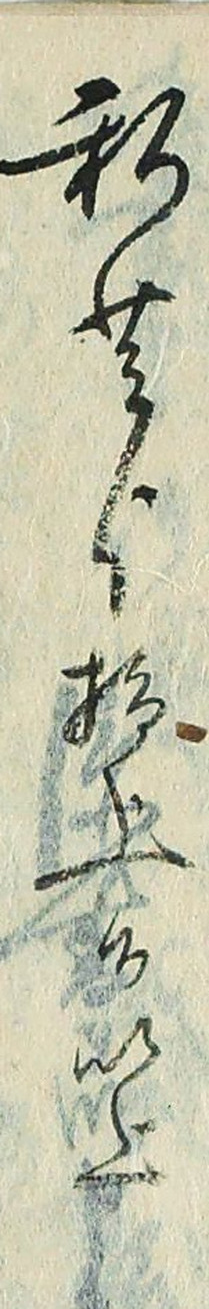私共ゟ指上候以上
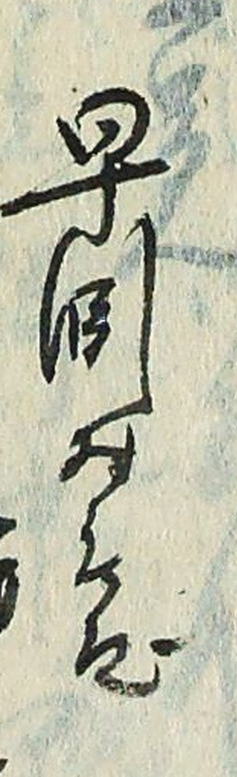早淵村庄屋
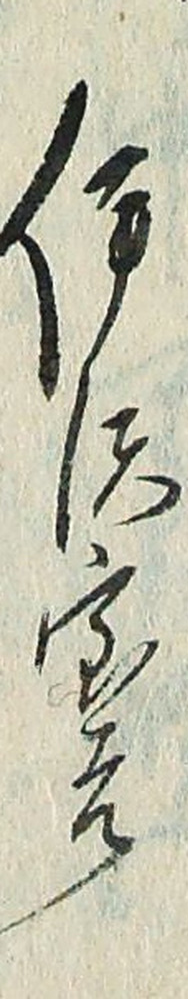伊沢宝吉
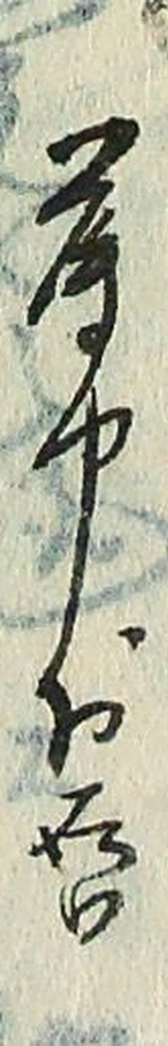矢ノ村右同
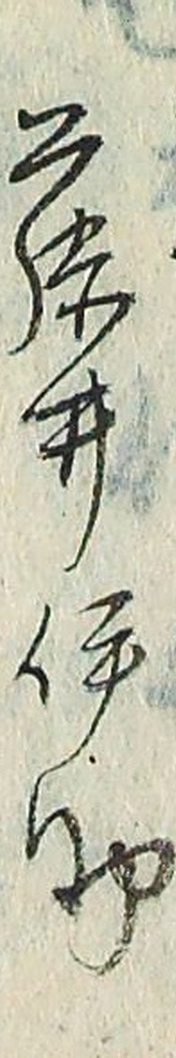藤井伊助
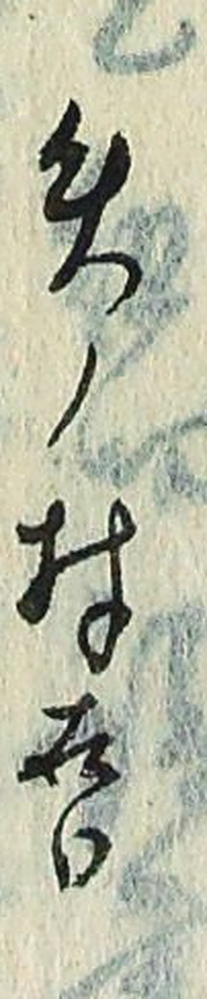矢ノ村右同
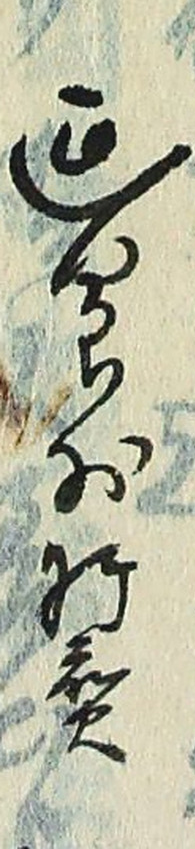延命村肝煎
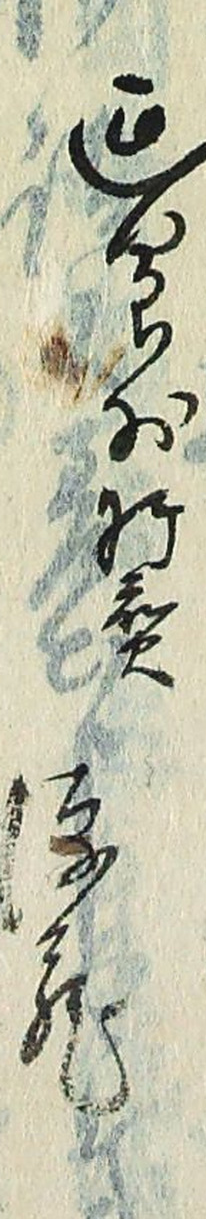延命村肝煎
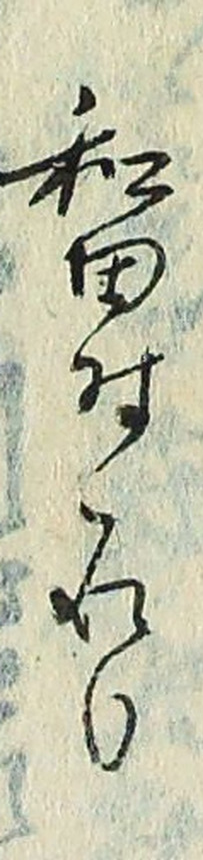和田村右同
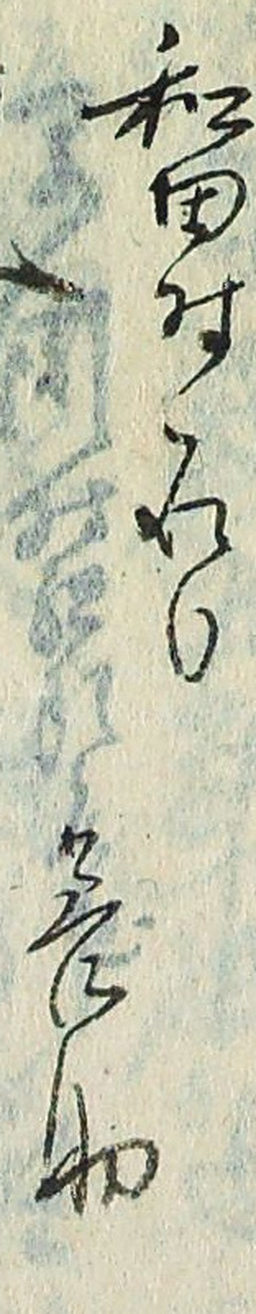和田村右同
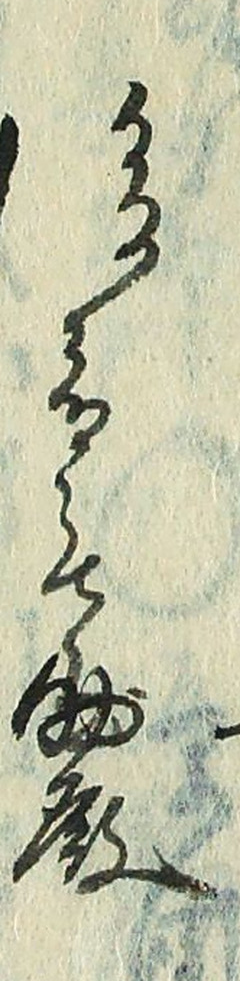後藤庄助殿
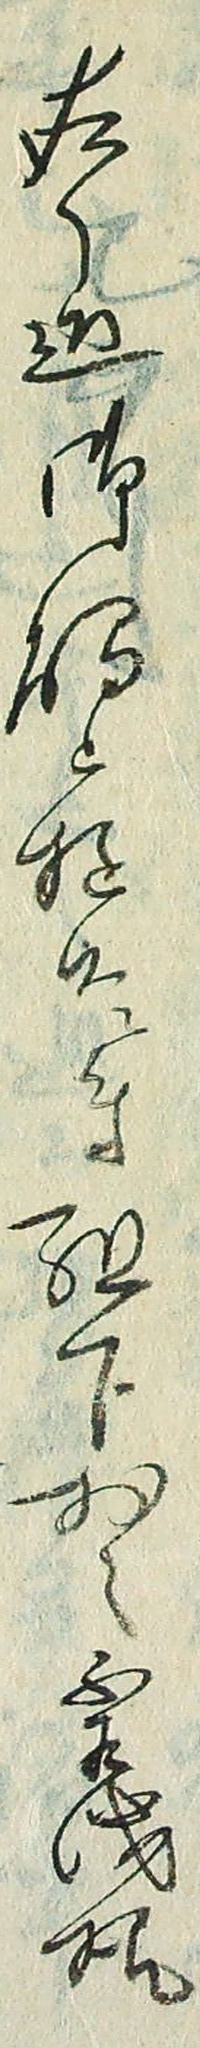右之通御触被遊候に付組下村々不洩様
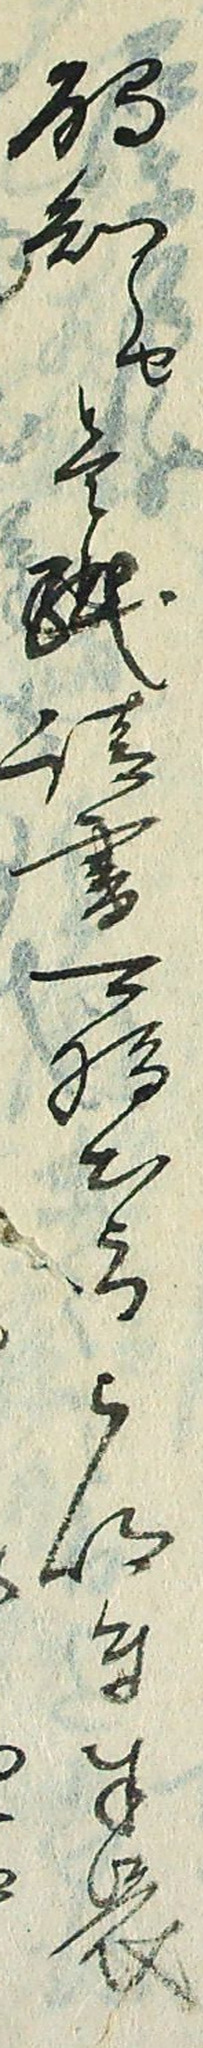触知らせ壱紙請書可指出旨被仰付奉畏
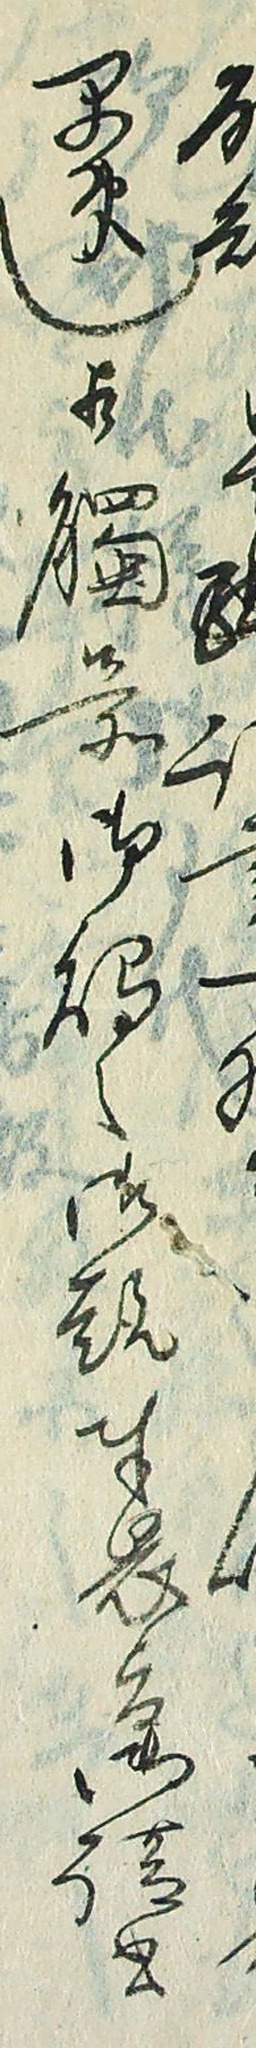早速相触候所御触之御趣奉畏旨御請書
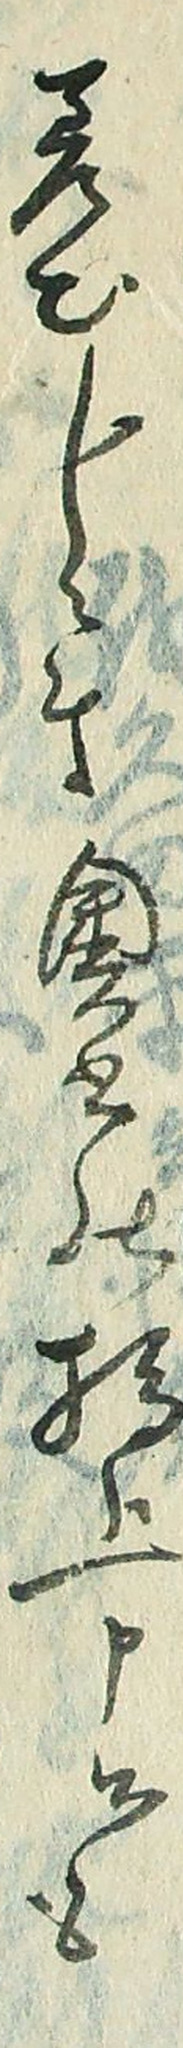差出申に付奥書仕指上申候以上
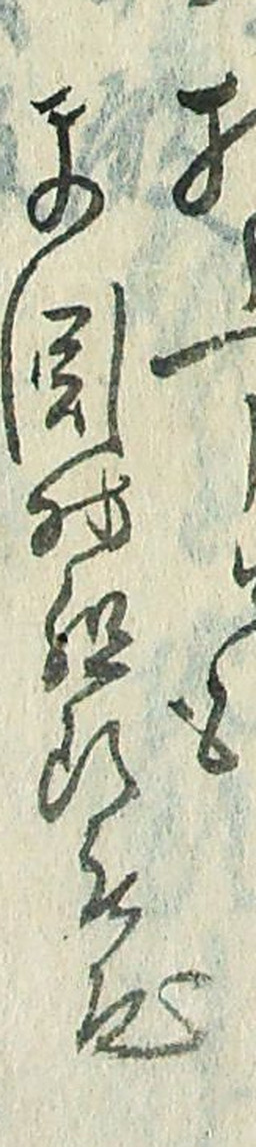早淵村組頭庄屋
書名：諸御用御□受書控
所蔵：鳴門教育大学 Naruto University of Education
